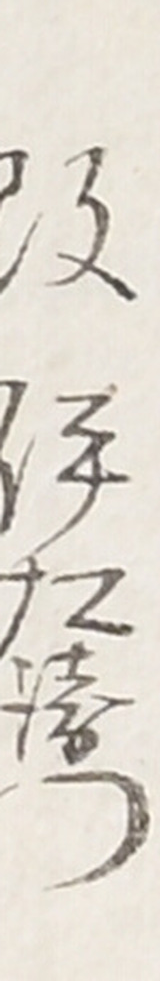改伊左衛門
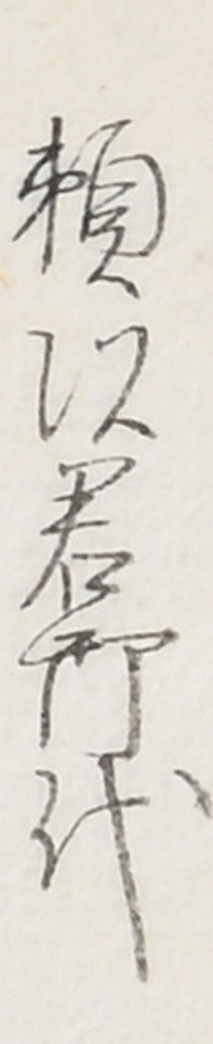頼以君御代
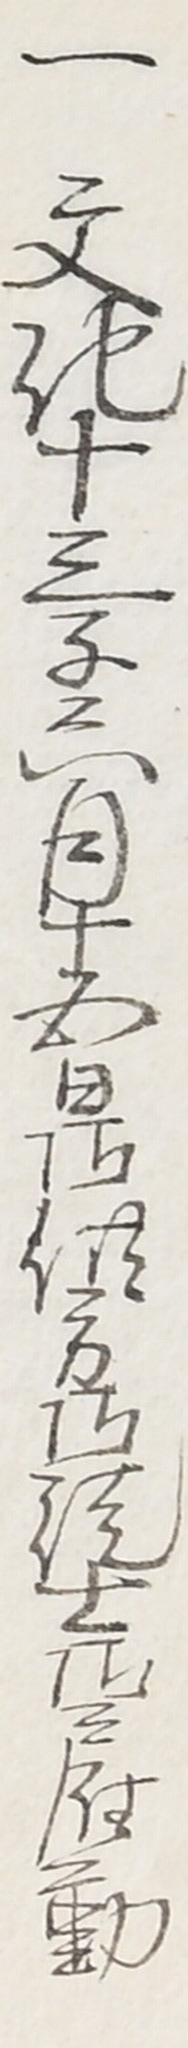一文化十三子六月十五日御供方御徒士御雇勤
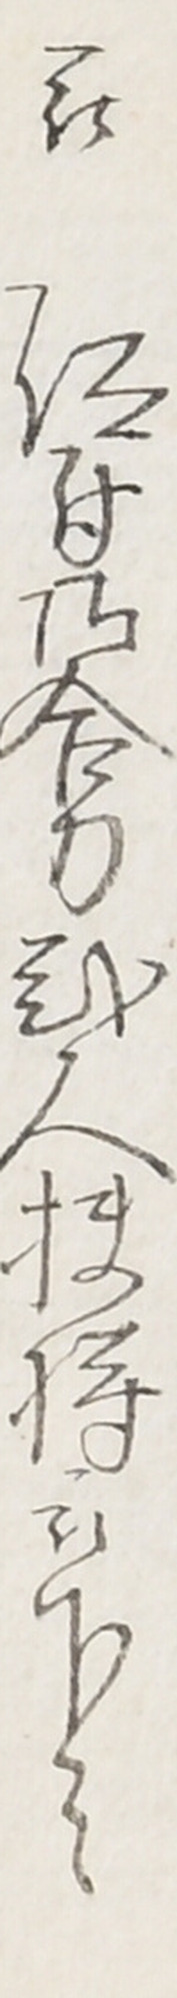被仰付御合力弐人扶持被下之
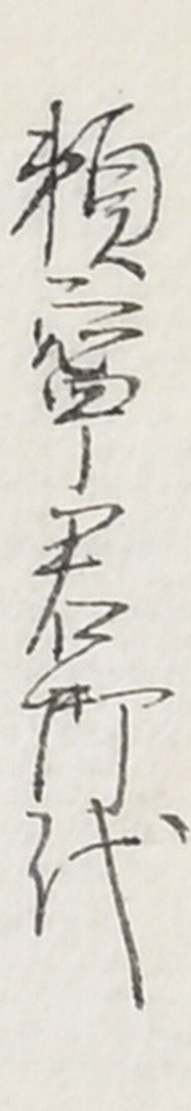頼寧君御代
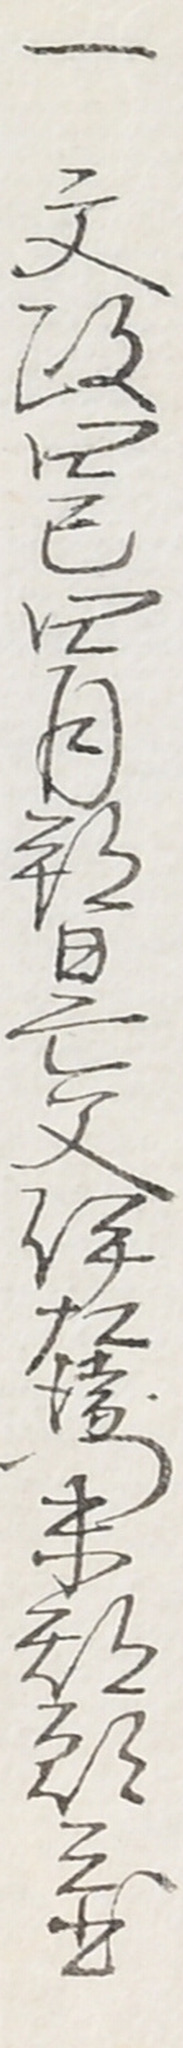一文政四巳四月朔日亡父伊左衛門末期願置
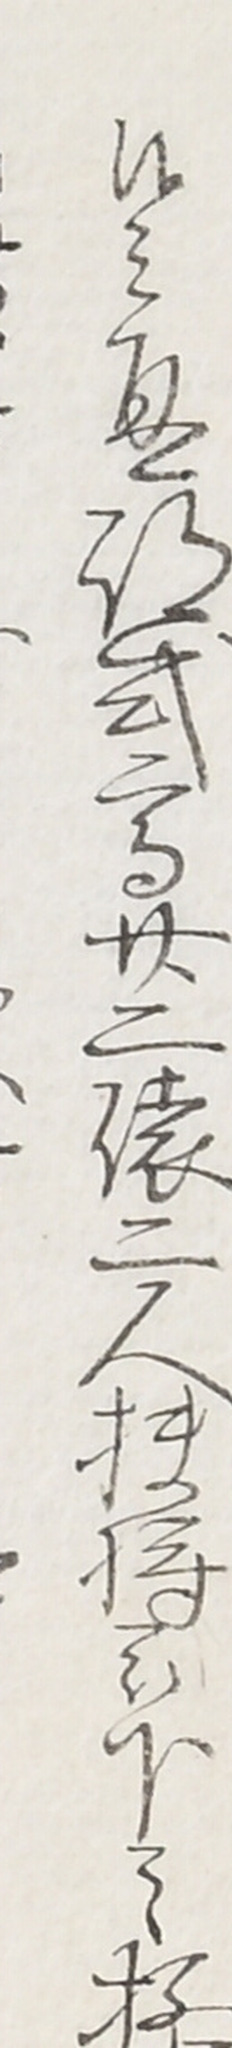候之通跡式高廿二俵二人扶持被下之格式
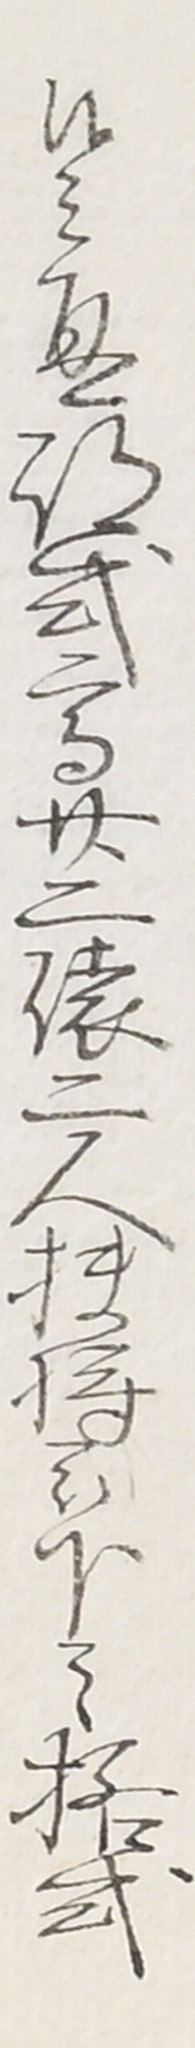候之通跡式高廿二俵二人扶持被下之格式
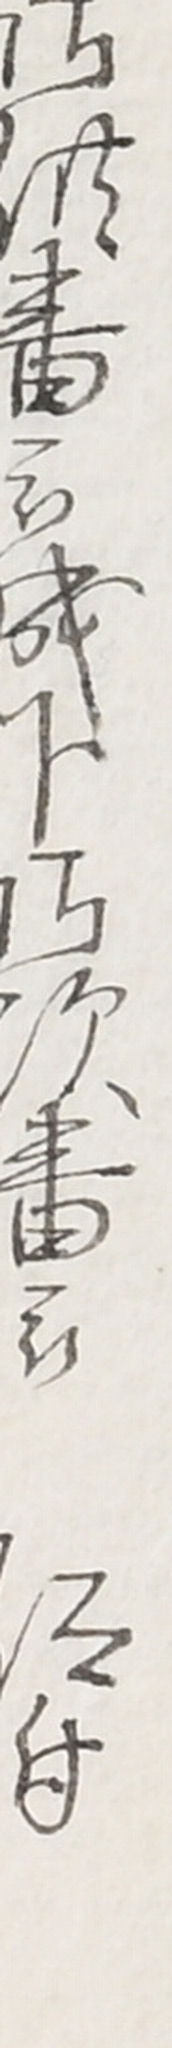御供番被成下御次番被仰付
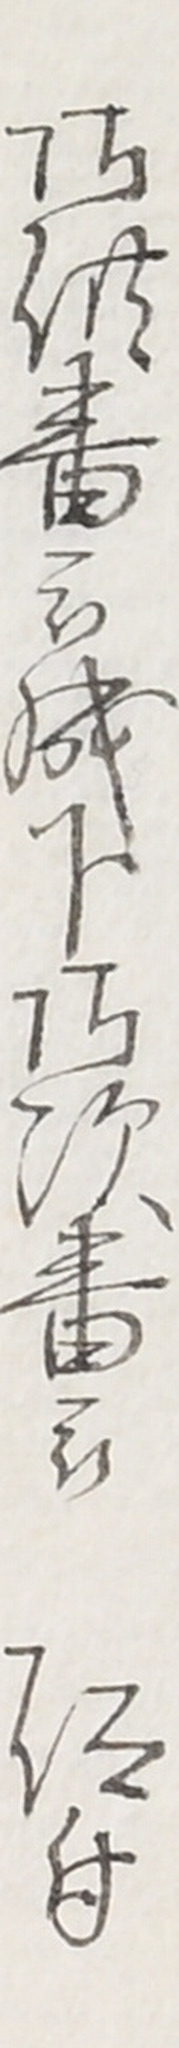御供番被成下御次番被仰付
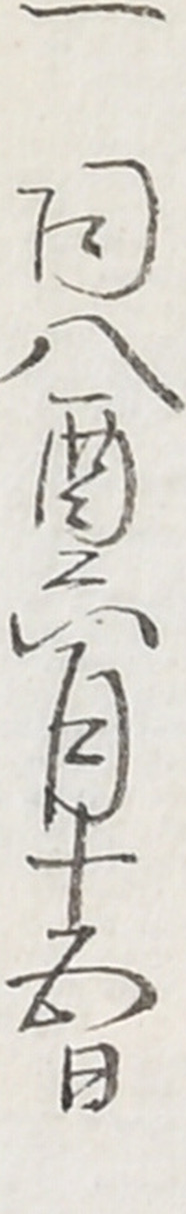一同八酉六月十五日
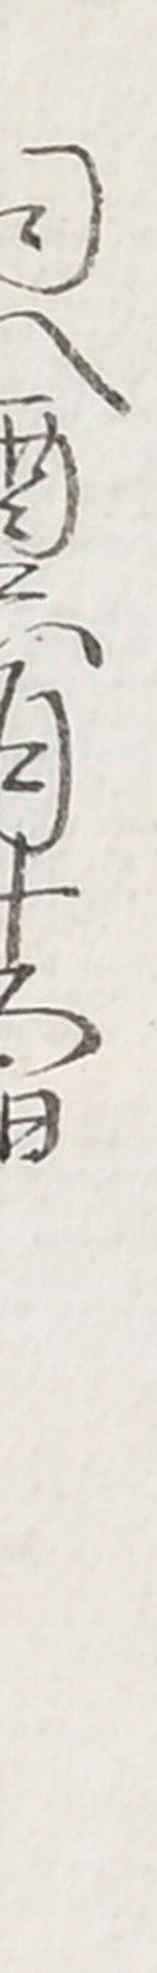一同八酉六月十五日
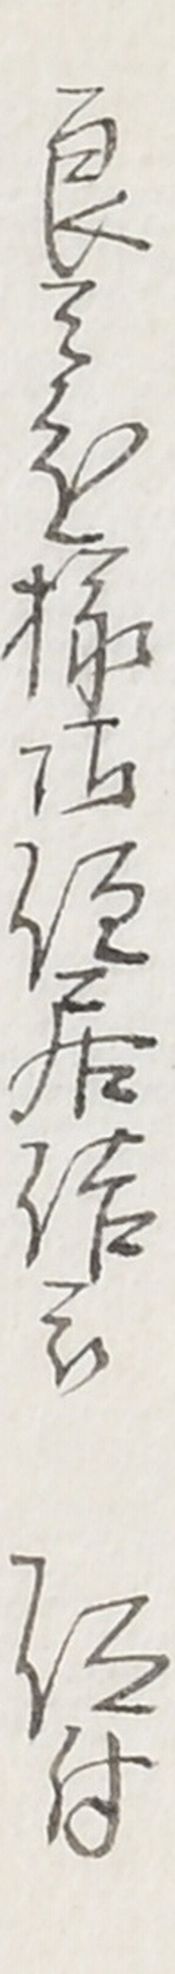良之進様御住居詰被仰付
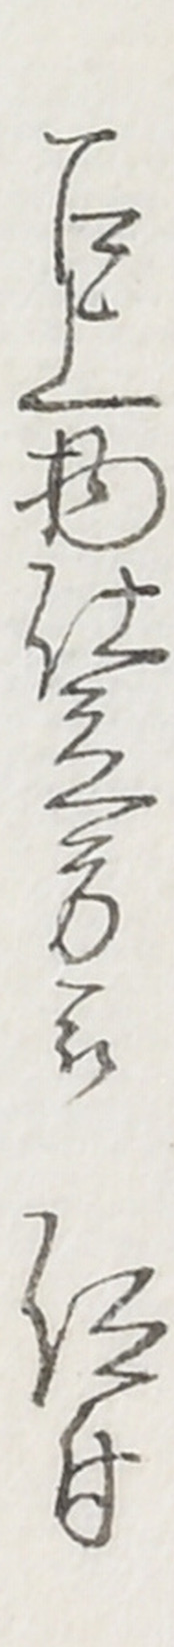召上物仕立方被仰付
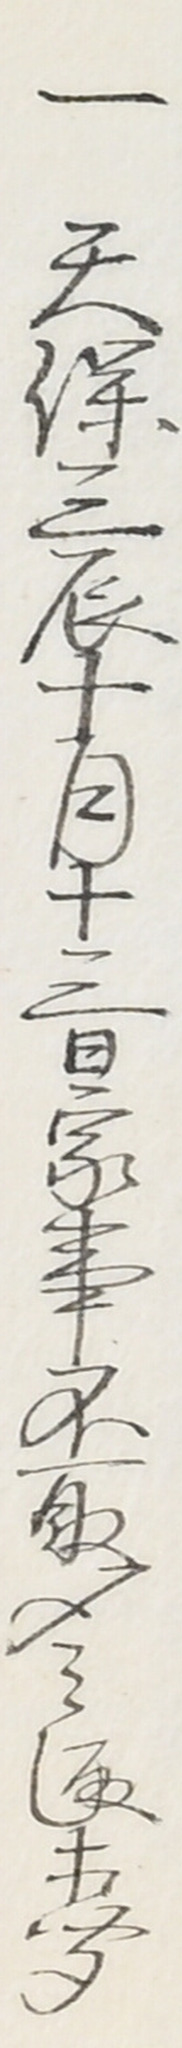一天保三辰十月十三日家事不取〆之趣相聞
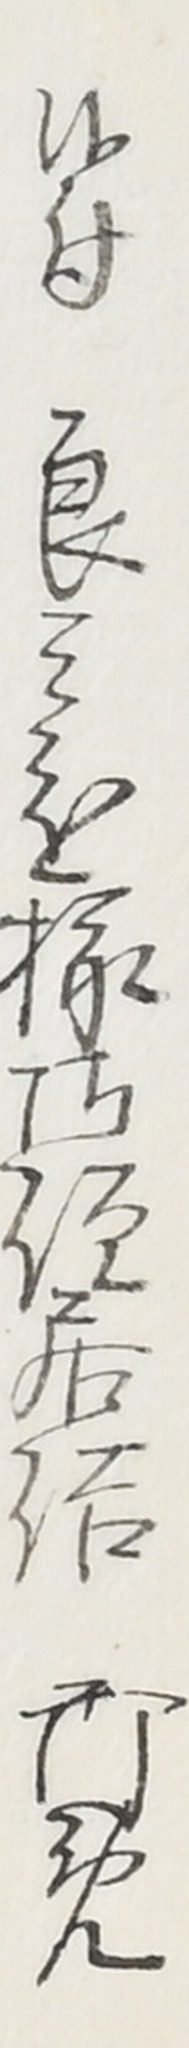候付良之進様御住居詰御免
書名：無足諸士勤仕録（四）
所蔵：伊那市立高遠町図書館・合同会社AMANE
